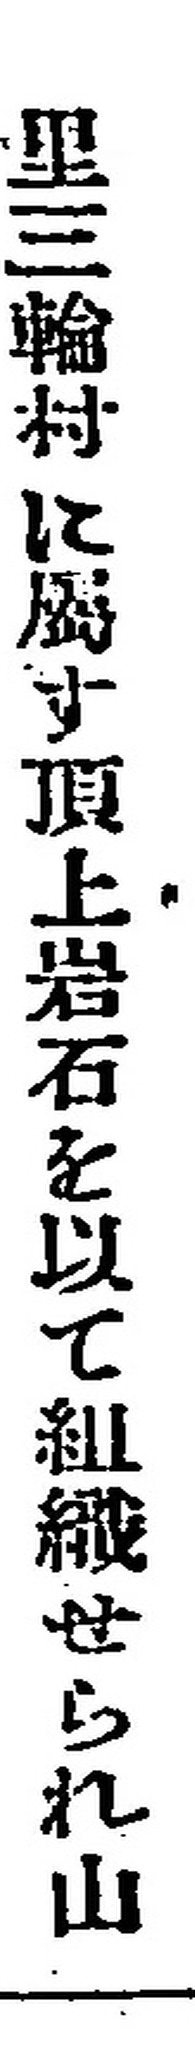里三輪村に属す頂上岩石を以て組織せられ山
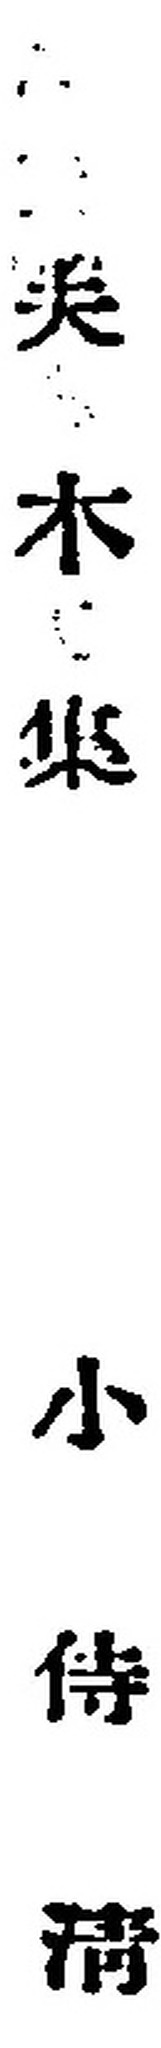夫木集小侍清
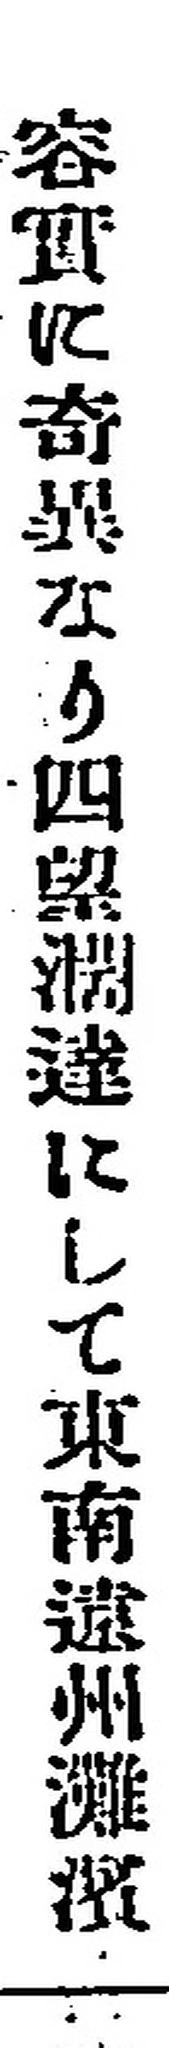容実に奇異なり四望濶達にして東南遠州灘浜
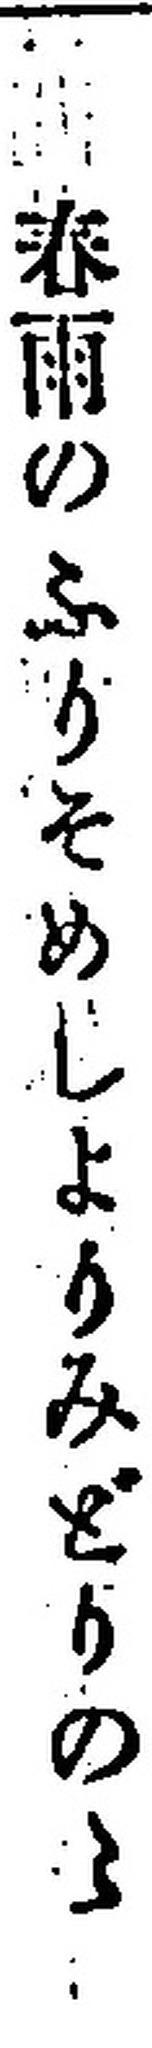春雨のふりそめしよりみどりのゝ
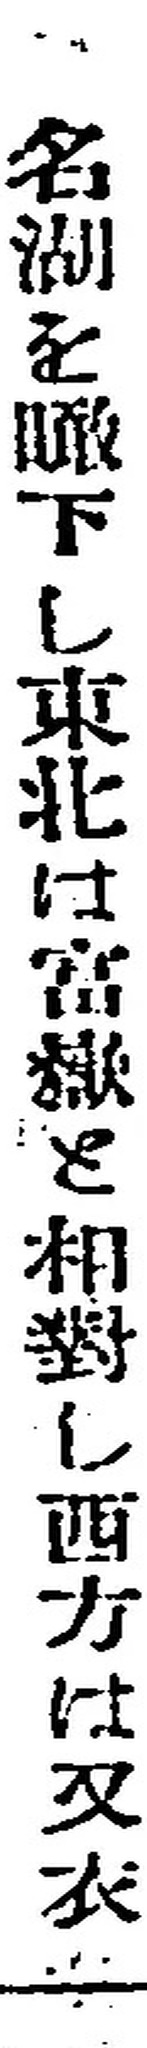名湖を瞰下し東北は富嶽と相対し西方は又衣
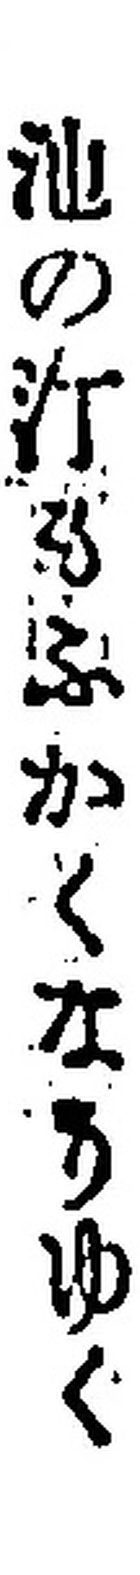池の汀もふかくなりゆく
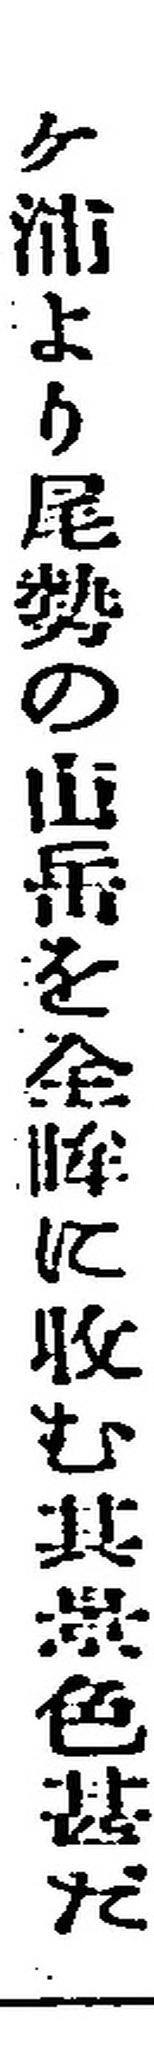ヶ浦より尾勢の山岳を全眸に収む其景色甚だ
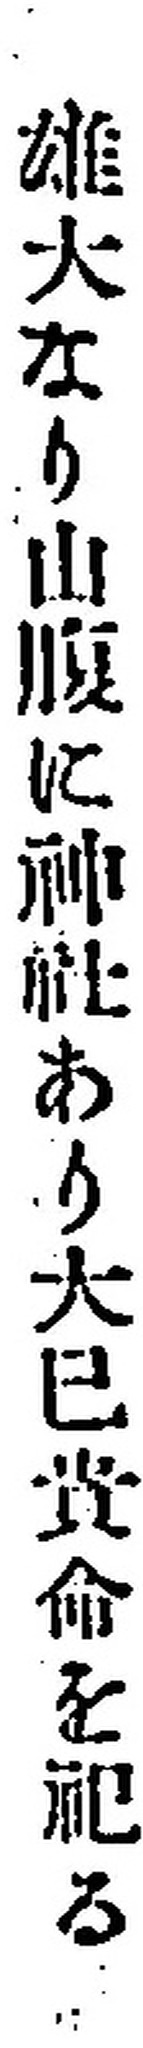雄大なり山腹に神社あり大巳貴命を祀る
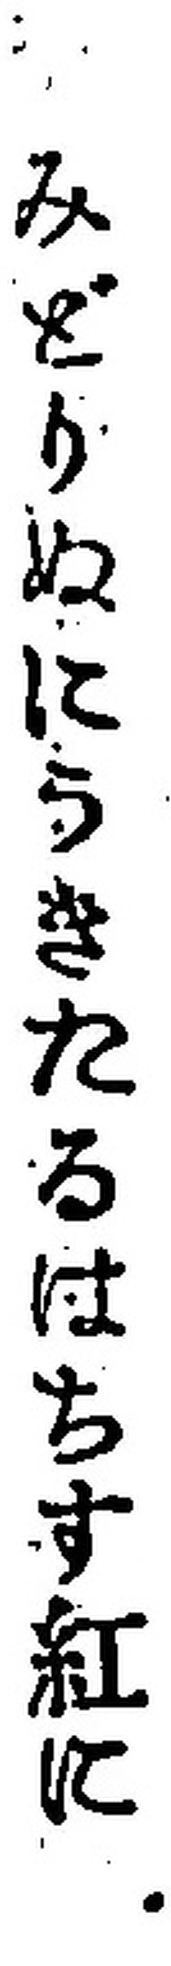みどりぬにうきたるはちす紅に
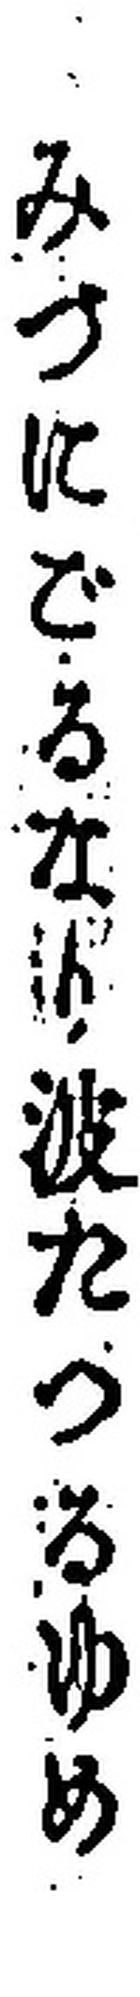みづにごるなり波たつるゆめ
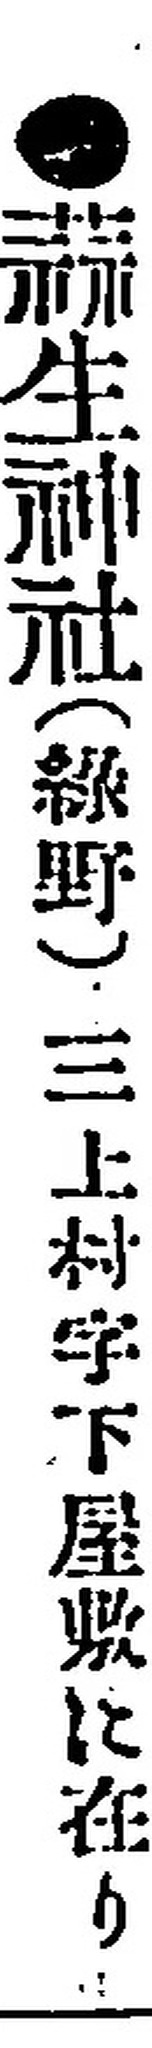●蒜生神社(緑野)三上村字下屋敷に在り
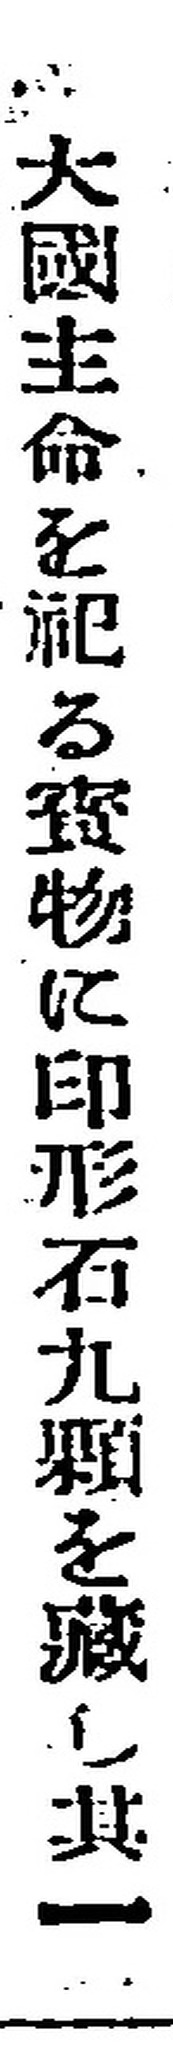大国主命を祀る宝物に印形石九顆を蔵し其一
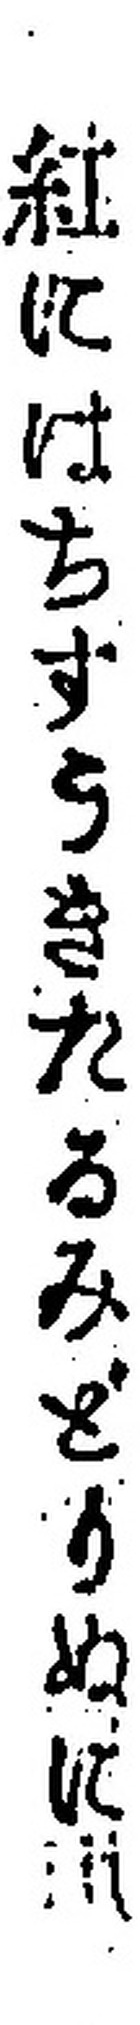紅にはちすうきたるみどりぬに
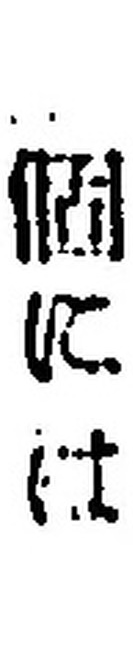個には
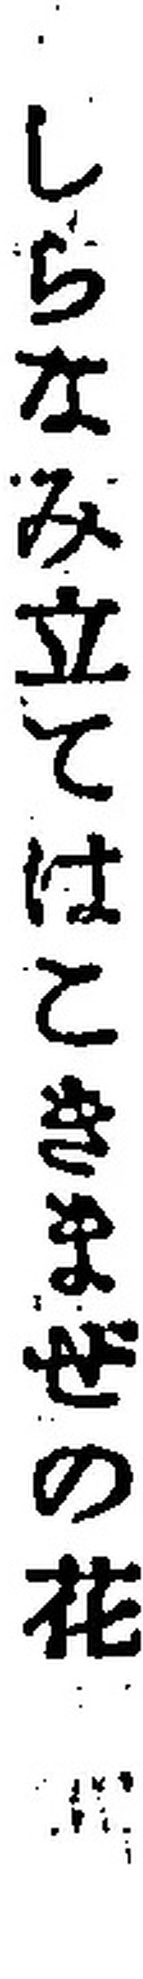しらなみ立てはこきまぜの花
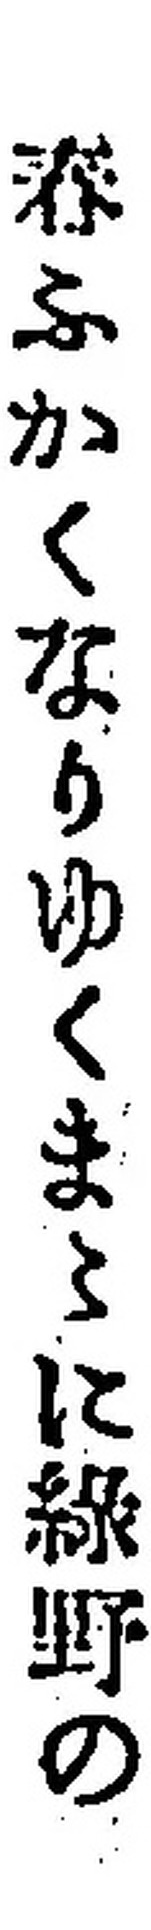春ふかくなりゆくまゝに緑野の
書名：東参名勝案内
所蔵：国立国会図書館 National Diet Library, JAPAN
